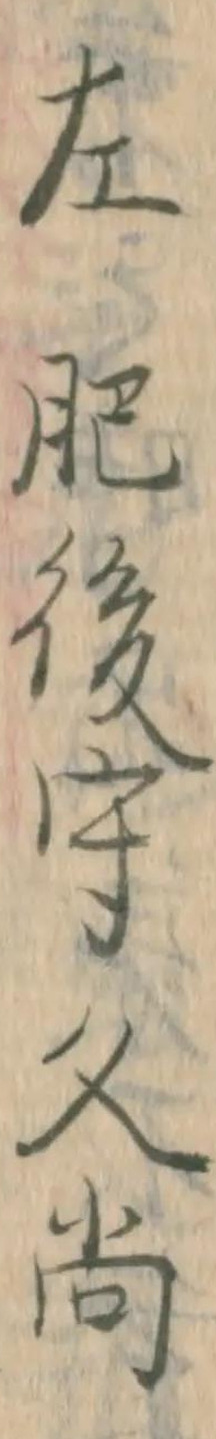左肥後守久尚
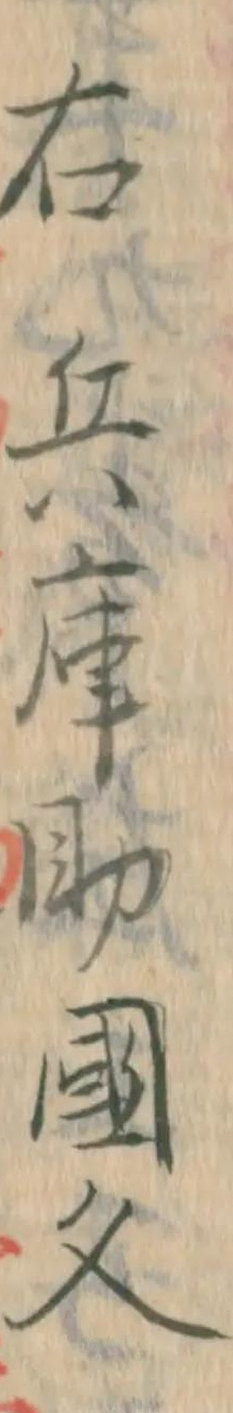右兵庫助国久
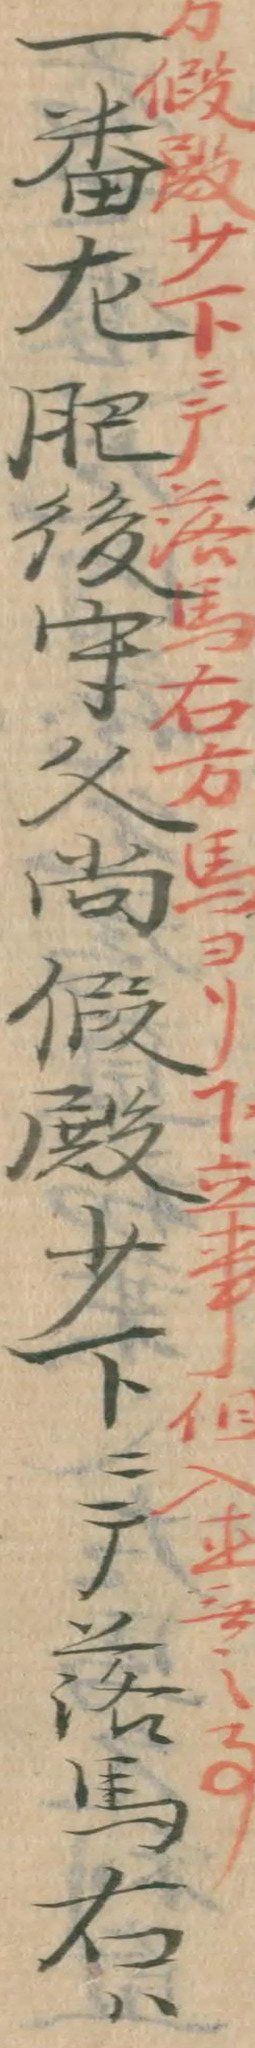一番左肥後守久尚仮殿少下ニテ落馬右ハ
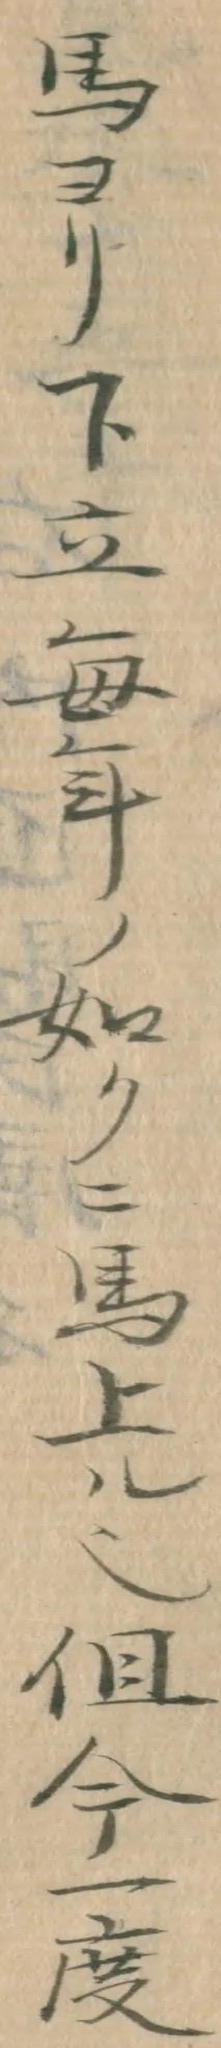馬ヨリ下立毎年ノ如クニ馬上ル也但今一度
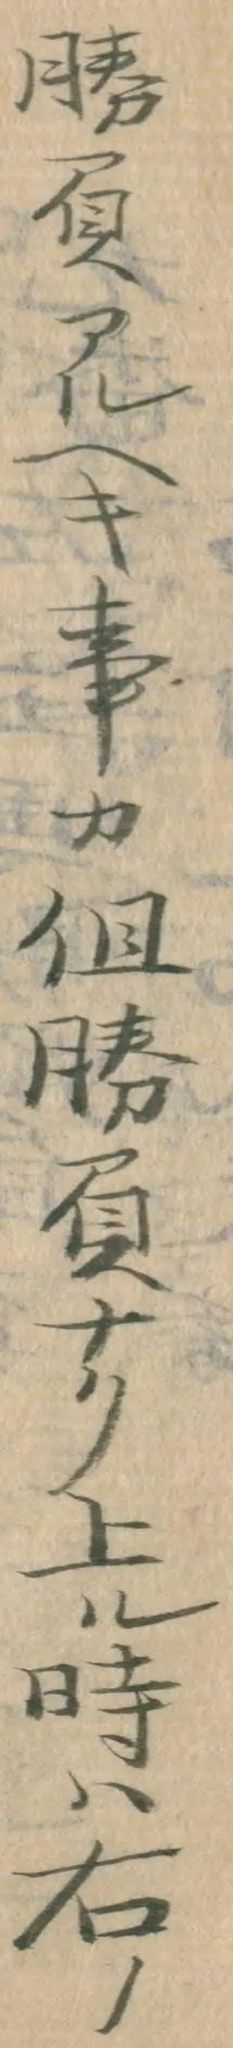勝負アルヘキ事カ但勝負ナリ上ル時ハ右ノ
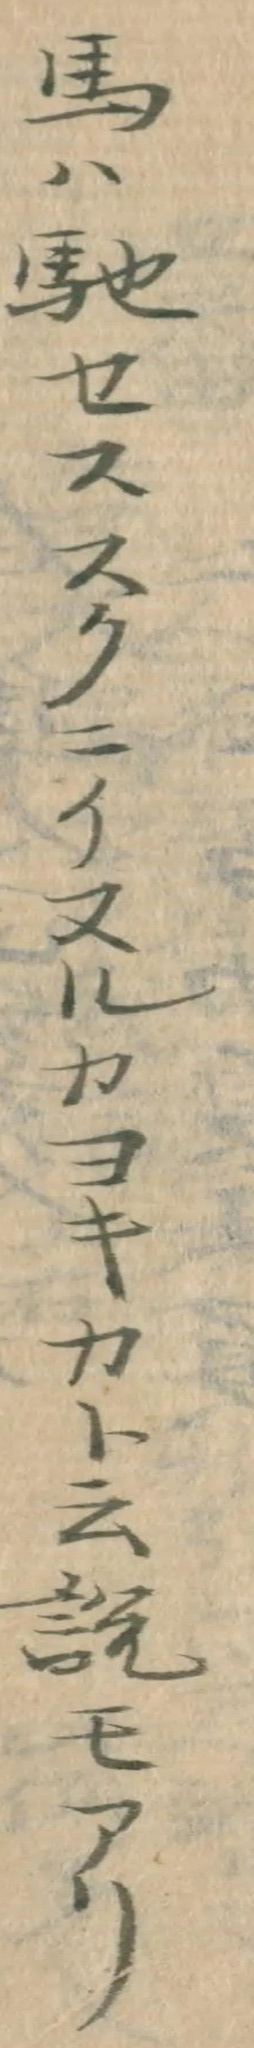馬ハ馳セススクニイヌルカヨキカト云説モアリ
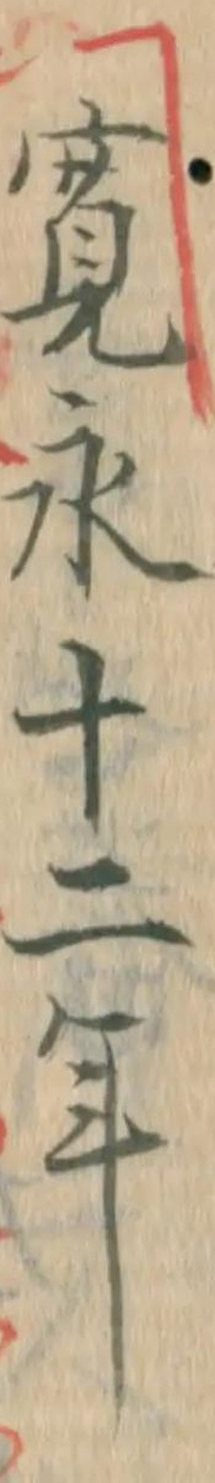寛永十二年
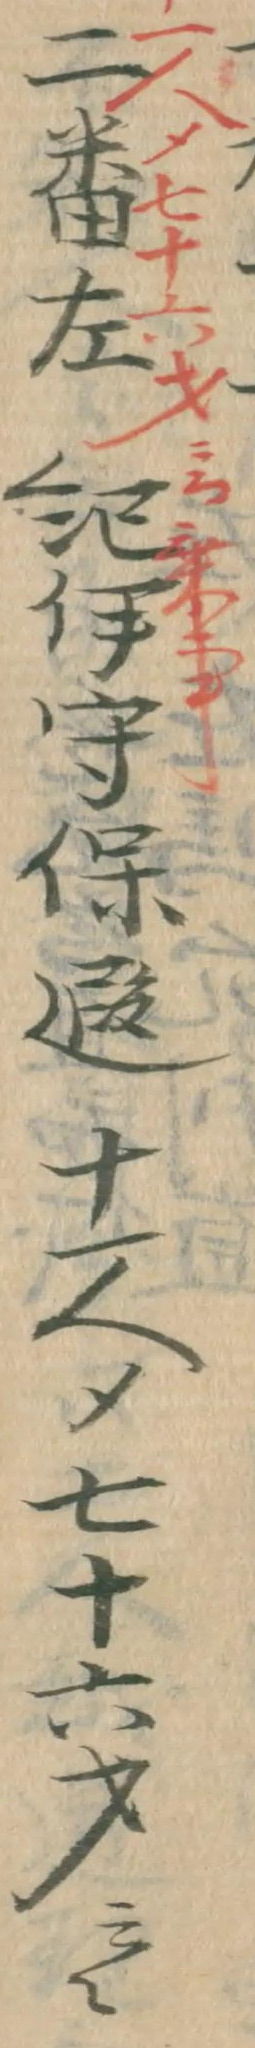二番左紀伊守保遐十一人〆七十六才云々

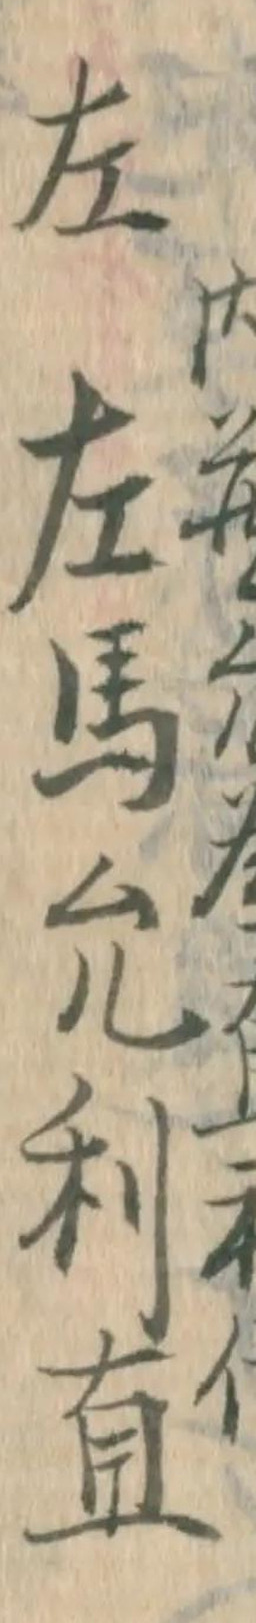左左馬允利直
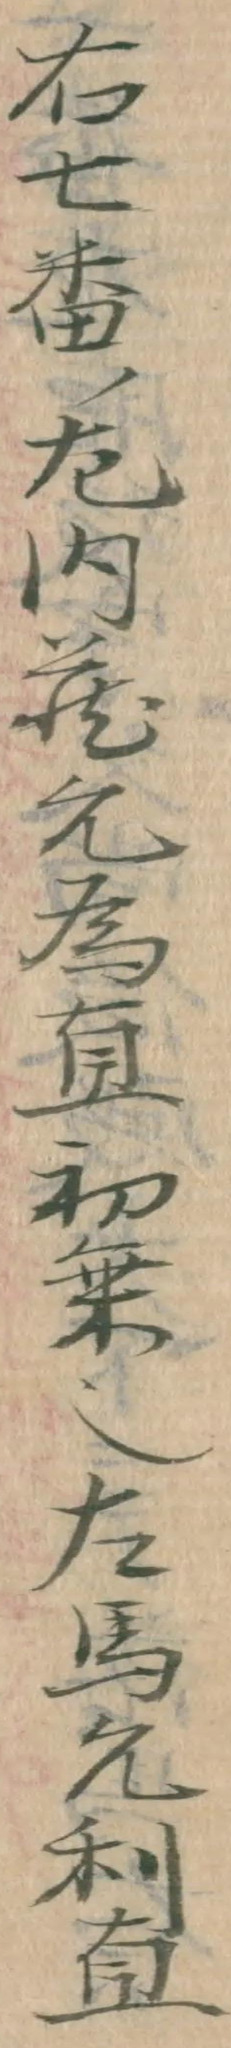右七番ノ左内蔵允為直初乗也左馬允利直
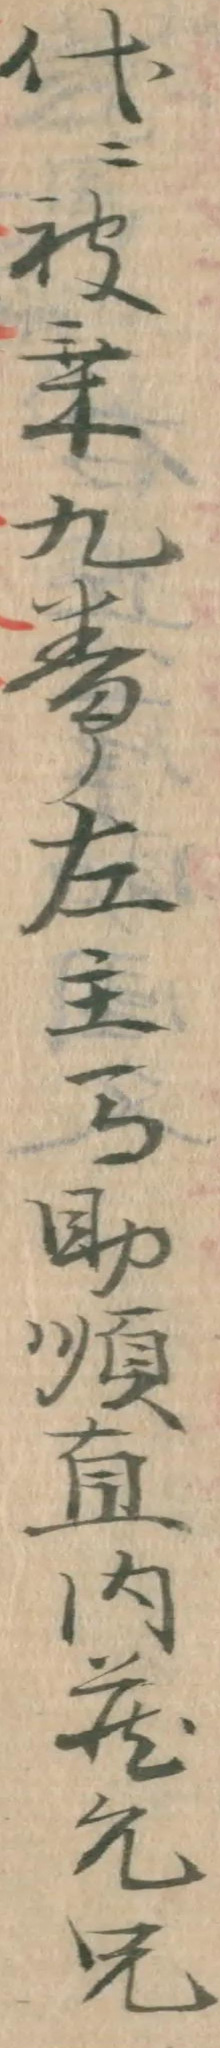代ニ被乗九番ノ左主馬助順直内蔵允兄
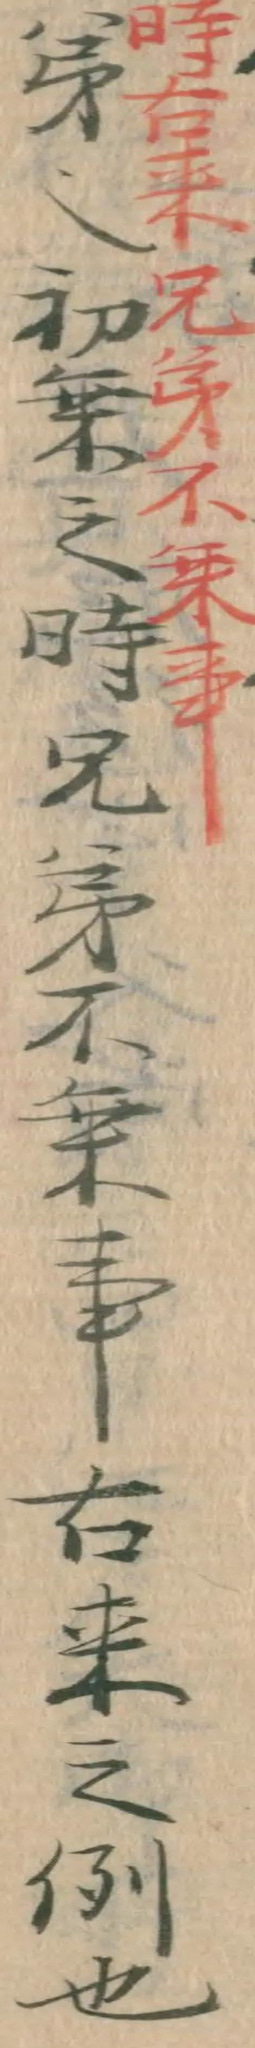弟也初乗之時兄弟不乗事古来之例也
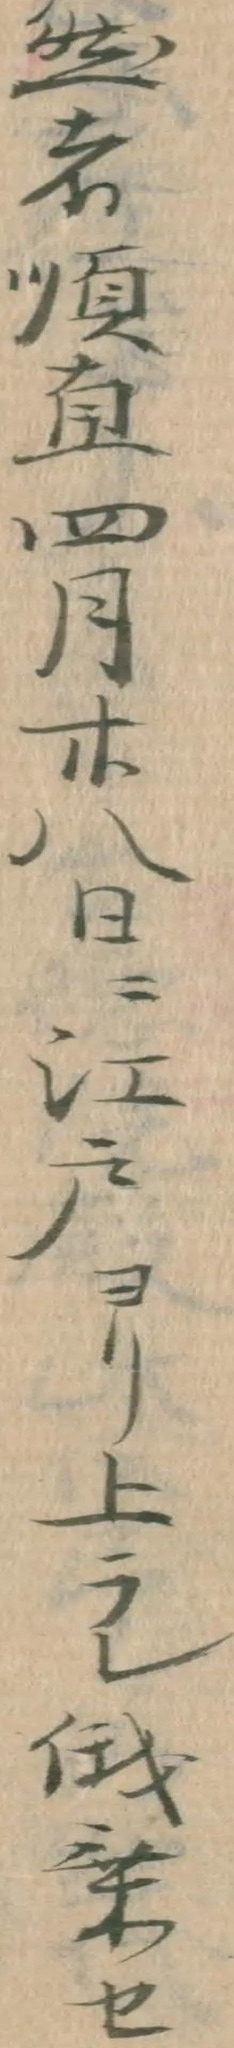然者順直四月廿八日ニ江戸ヨリ上ラレ俄乗セ
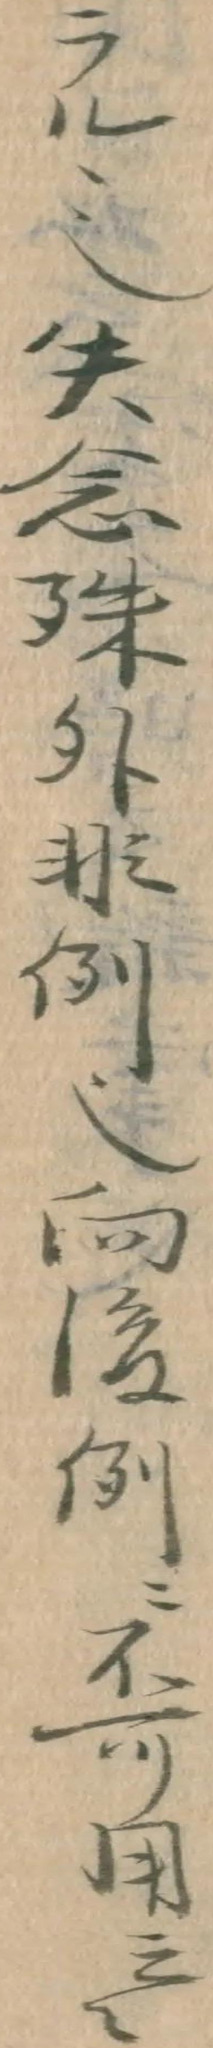ラルヽ也失念殊外非例也向後例ニ不可用云々
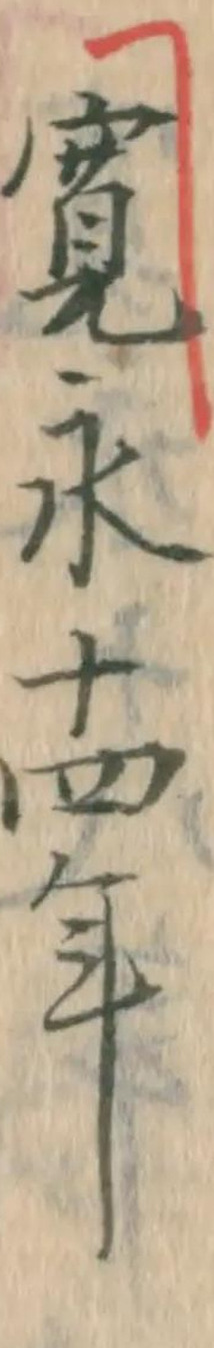寛永十四年
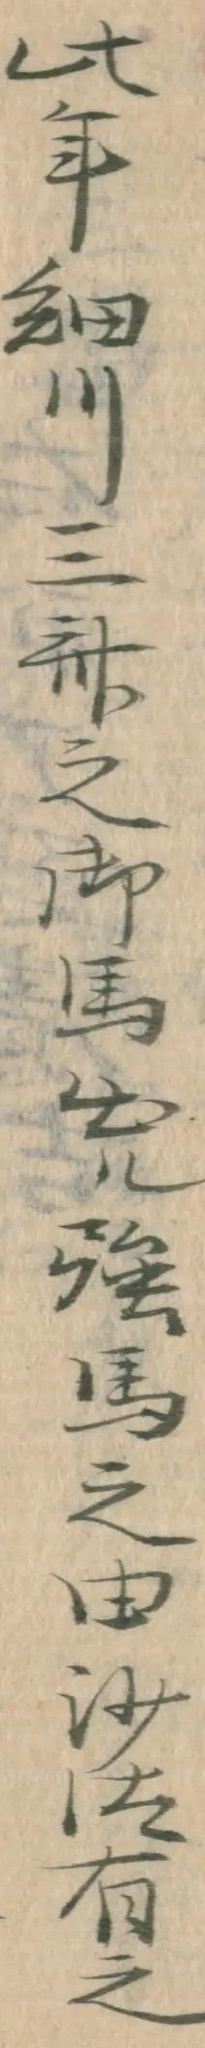此年細川三斎之御馬出ル強馬之由沙汰有之
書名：賀茂社記録. 第10冊
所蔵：国立国会図書館 National Diet Library, JAPAN
